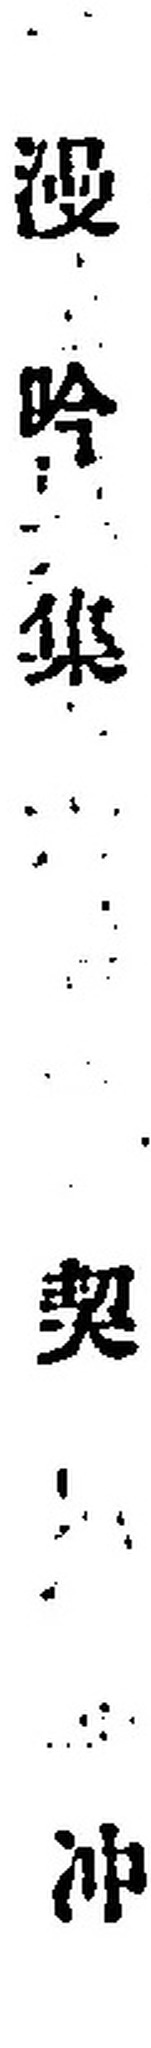漫吟集契冲
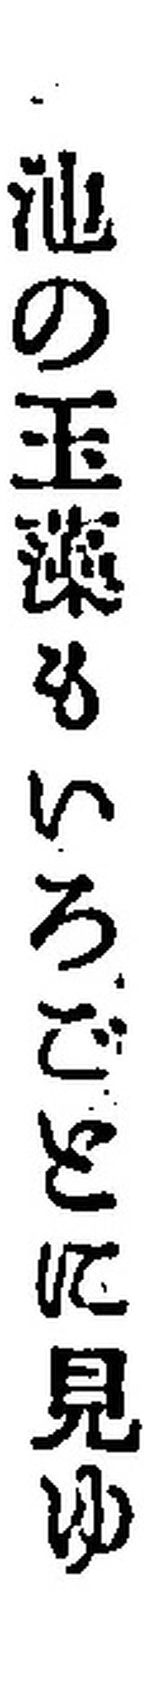池の玉藻もいろごとに見ゆ
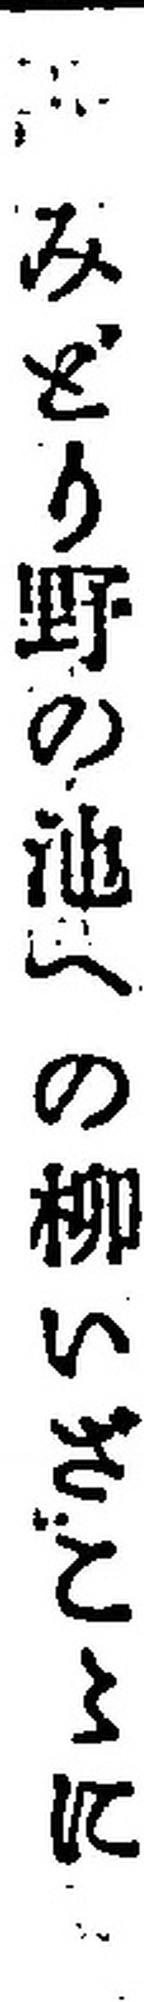みどり野の池への柳いざこゝに
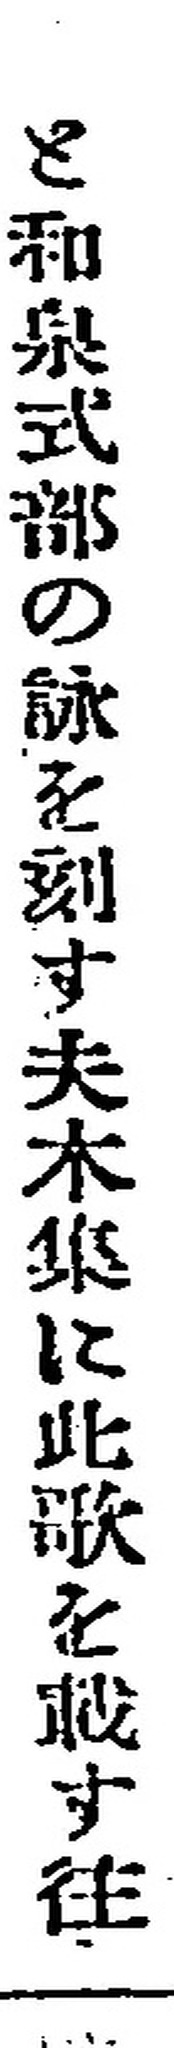と和泉式部の詠を刻す夫木集に此歌を載す往
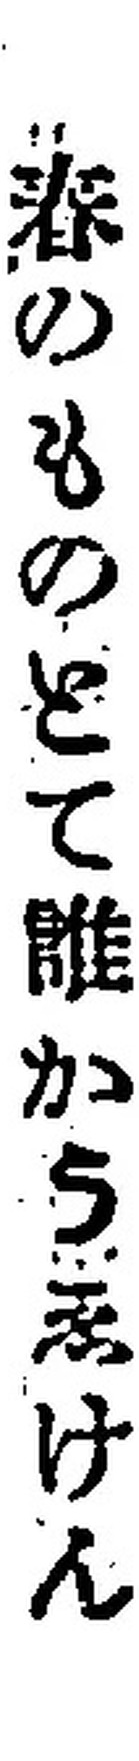春のものとて誰かうゑけん
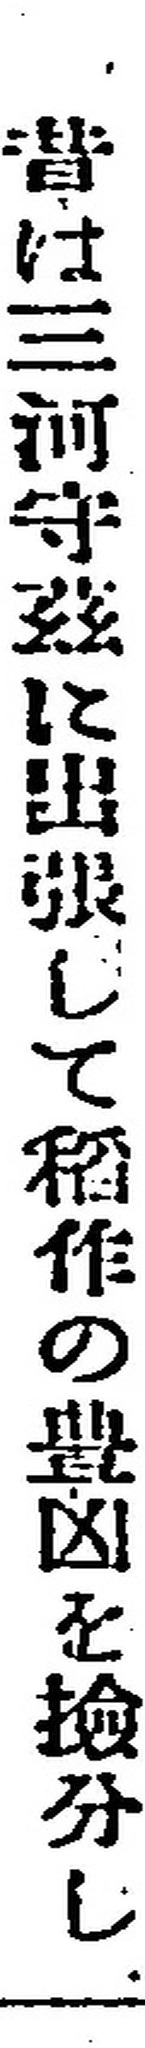昔は三河守茲に出張して稲作の豊凶を撿分し
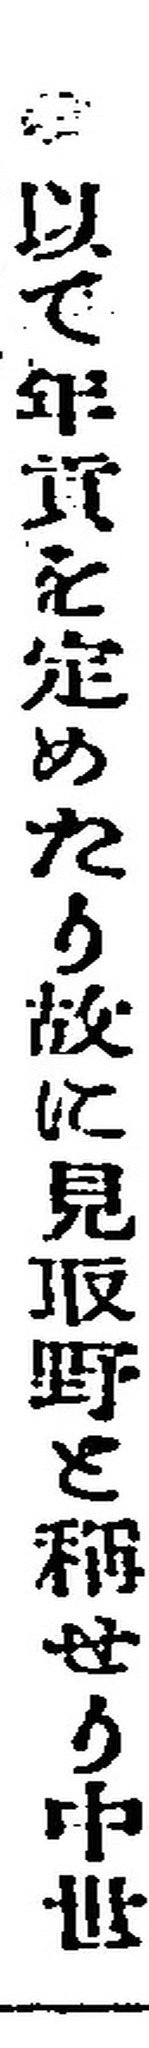以て年貢を定めたり故に見取野と称せり中世
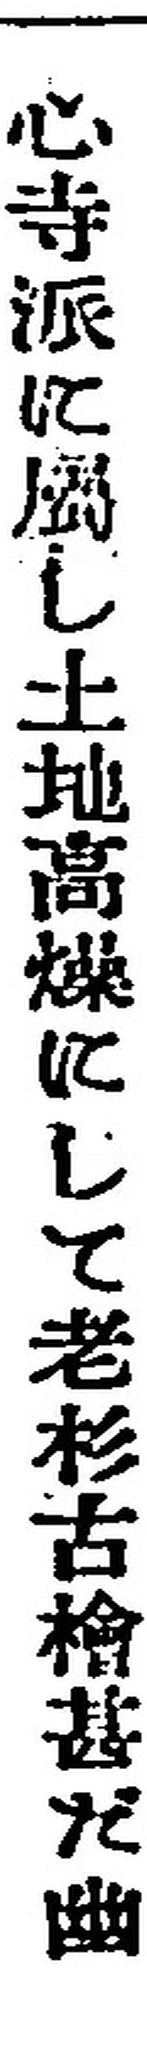心寺派に属し土地高燥にして老杉古檜甚だ幽
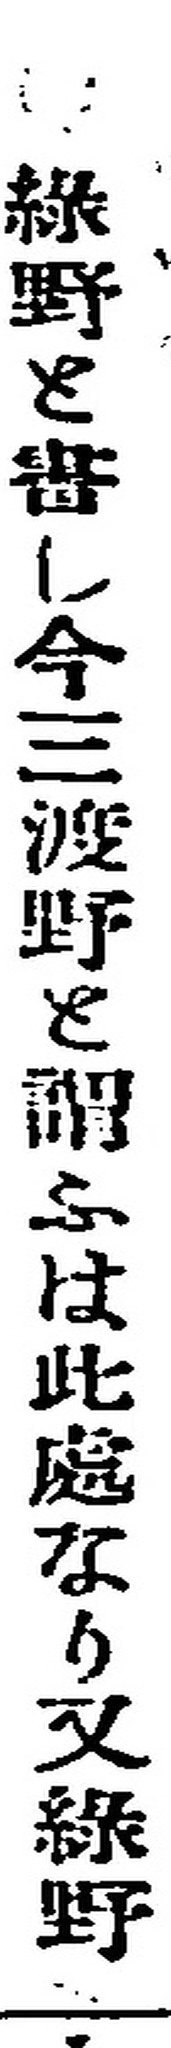緑野と書し今三渡野と謂ふは此処なり又緑野
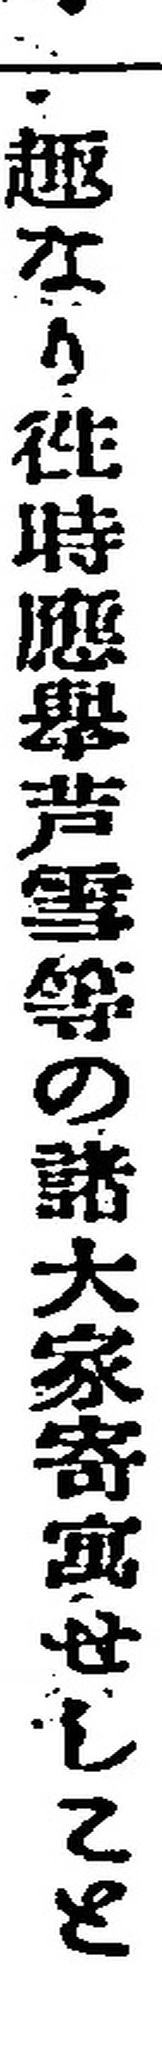趣なり往時応挙芦雪等の諸大家寄寓せしこと
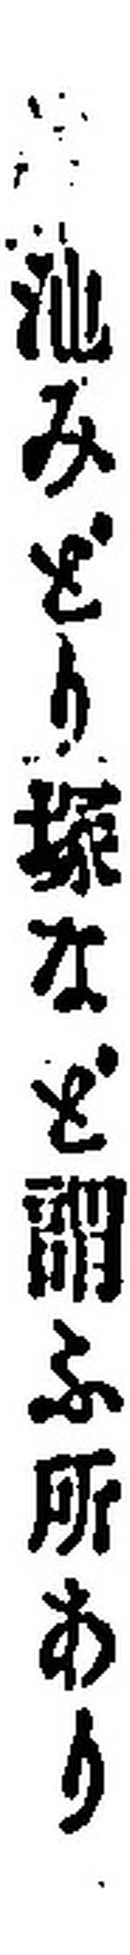池みどり塚など謂ふ所あり
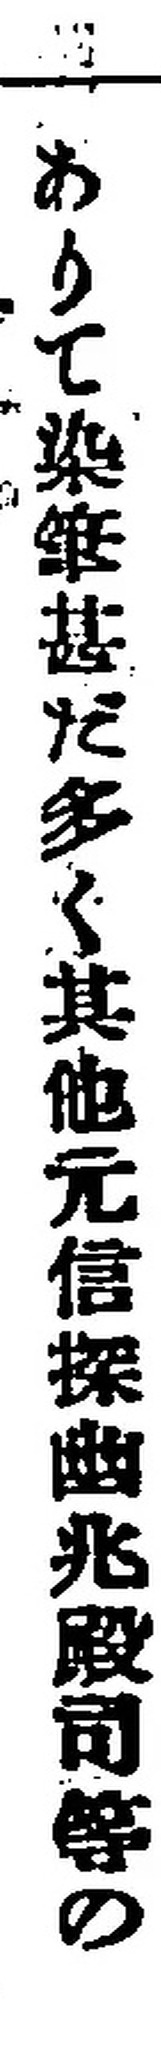ありて染筆甚だ多く其他元信探幽兆殿司等の
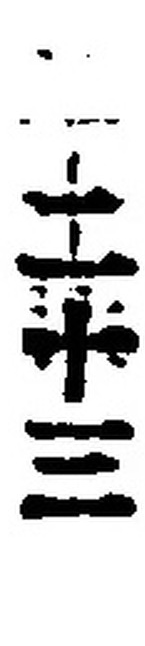二十三

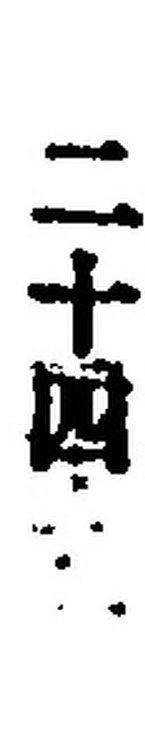二十四
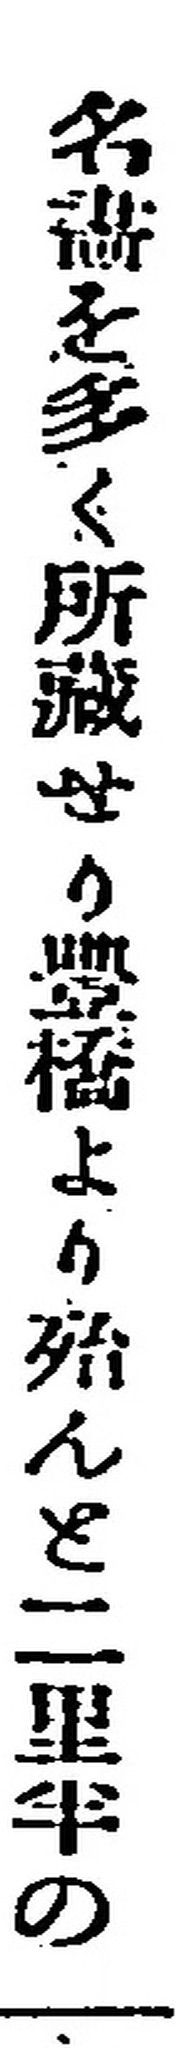名画を多く所蔵せり豊橋より殆んと二里半の
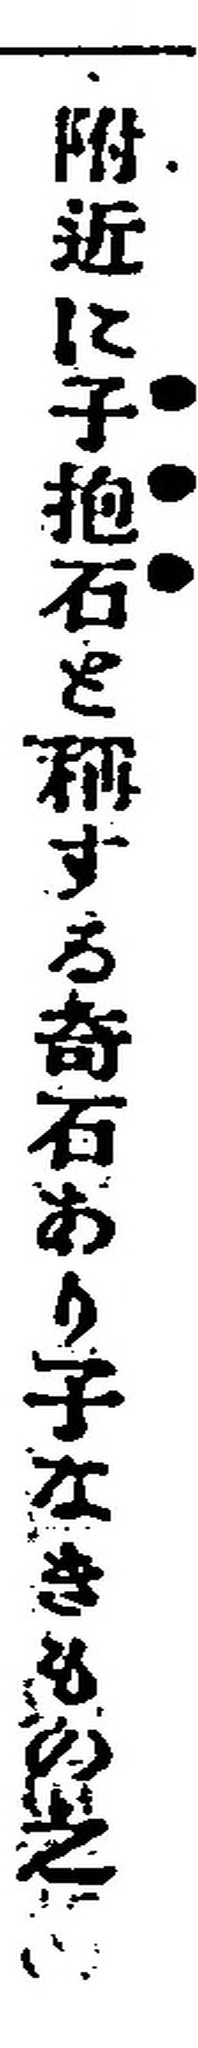附近に子抱石と称する奇石あり子なきもの之
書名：東参名勝案内
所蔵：国立国会図書館 National Diet Library, JAPAN
